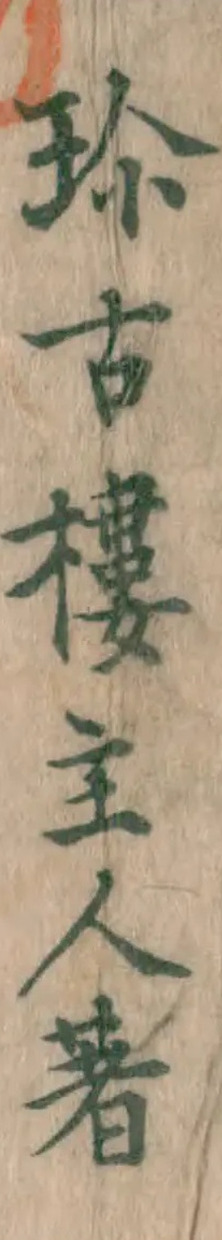珍古楼主人著
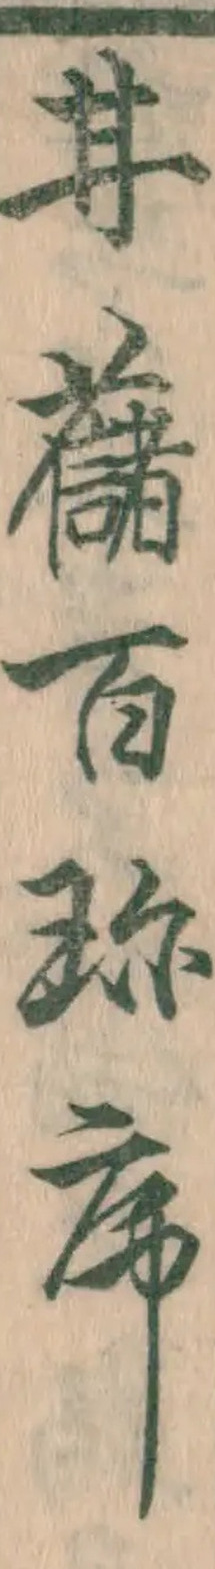甘藷百珍序
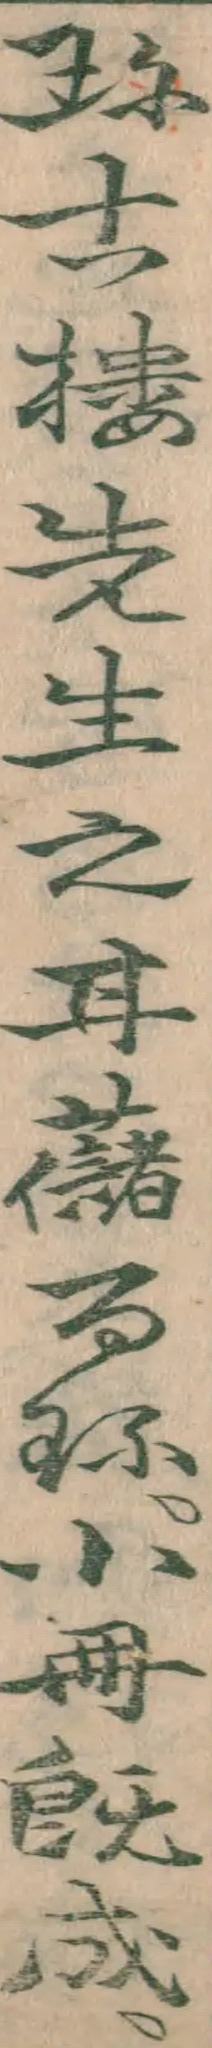珍古楼先生之甘藷百珍、小冊既成、
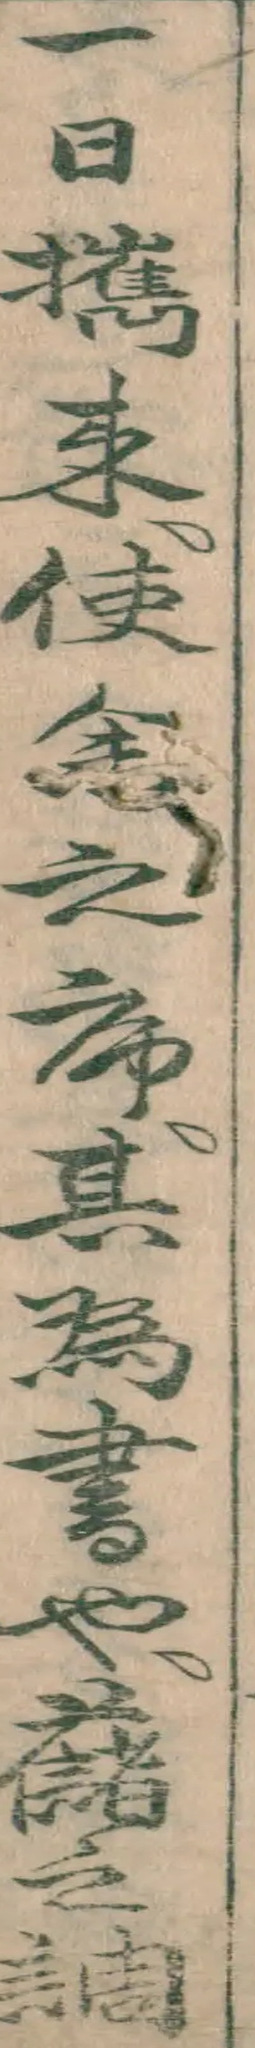一日携来、使余之序、其為書也、藷之調
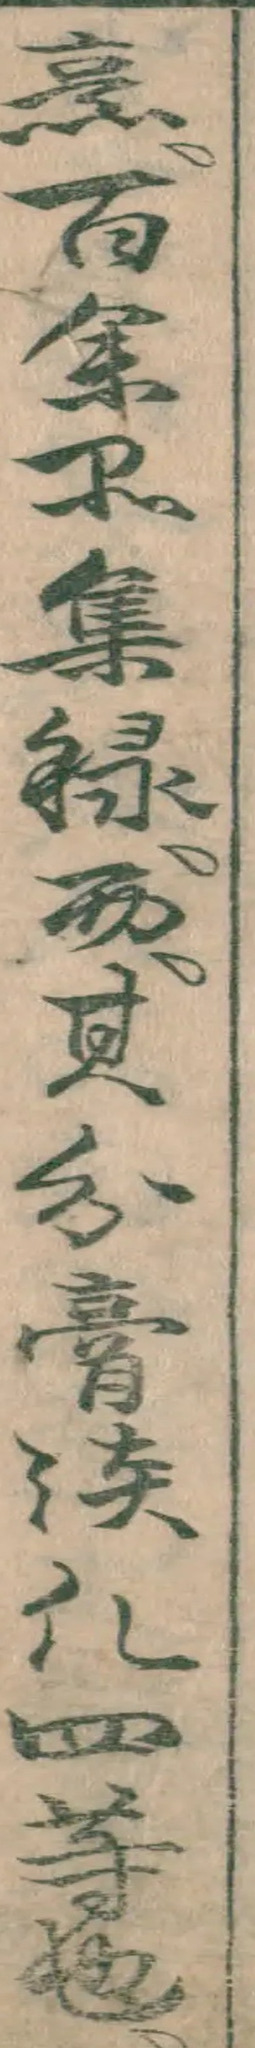烹、百余品集録、而、其分膏淡凡四等也、
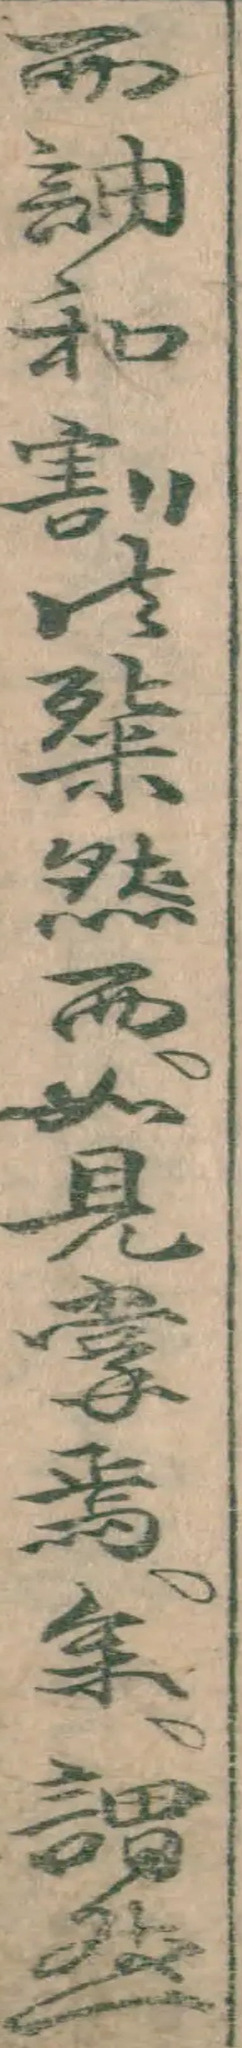而調和割法粲然而、如見掌焉、余、謂然
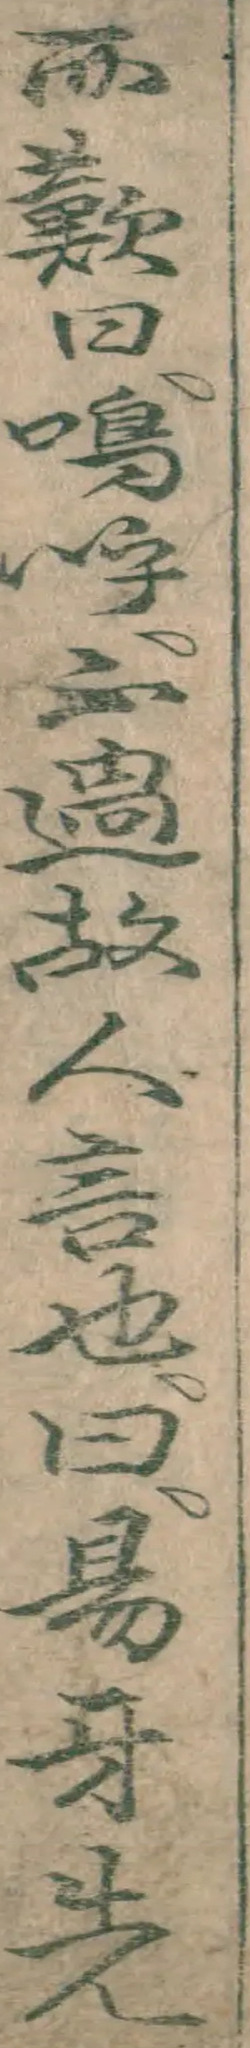而歎曰、嗚呼、不過故人言也、曰、易牙先
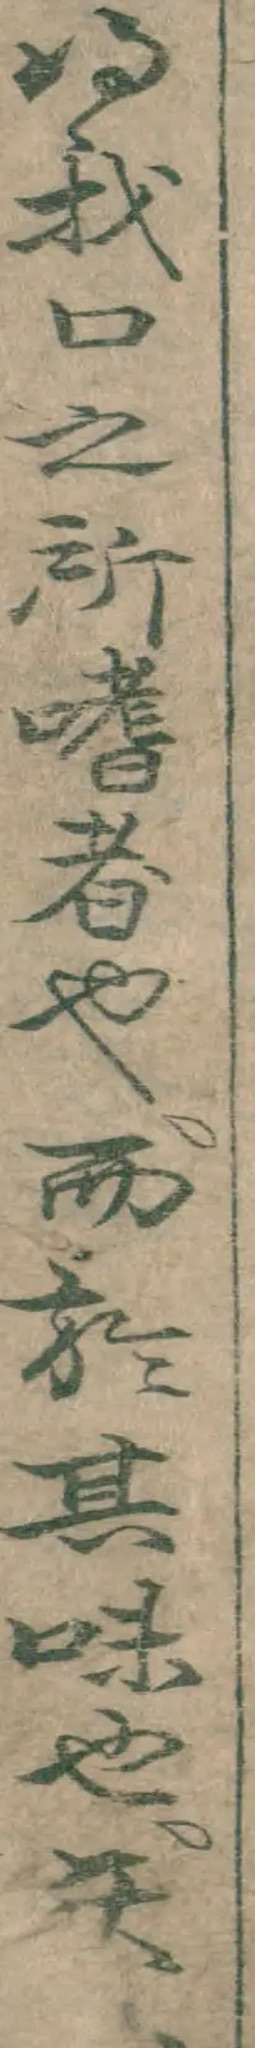得我口之所嗜者也、而於其味也、天下

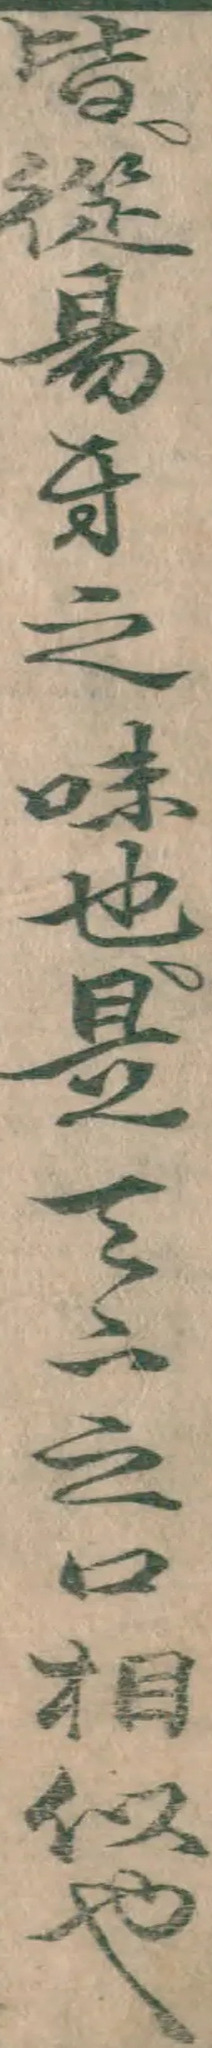皆。従易牙之味也。是天下之口相似也
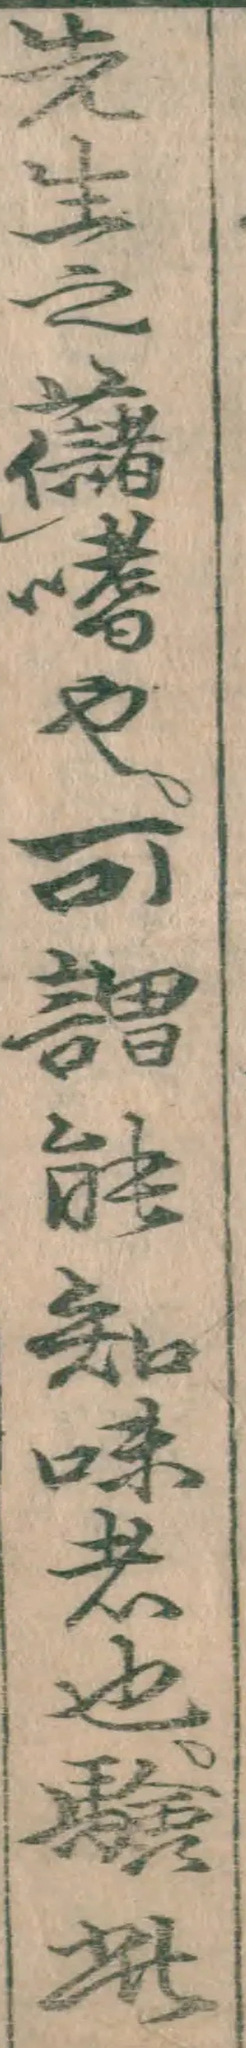先生之藷嗜也。可謂能知味者也。驗此
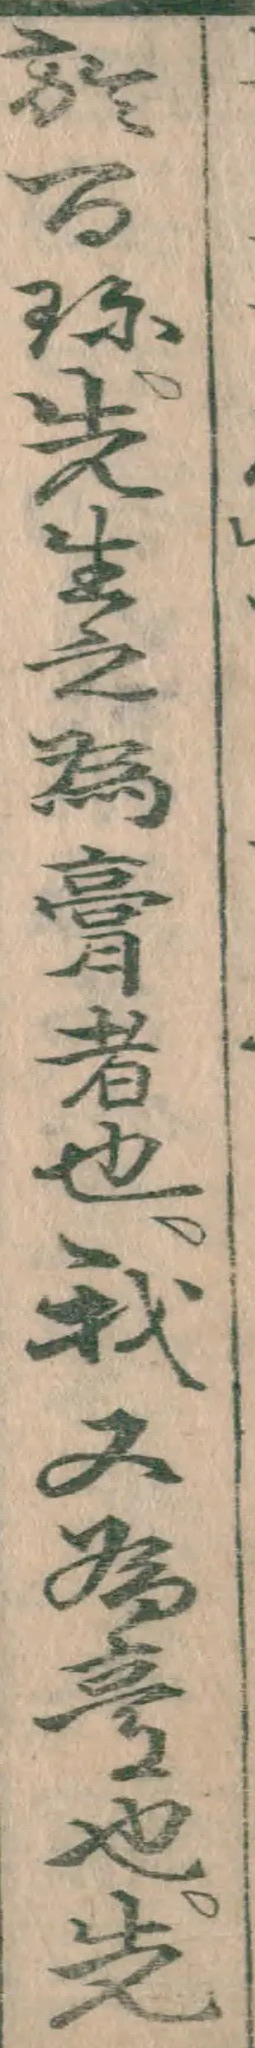於百珎。先生之為膏者也。我又為膏也。先
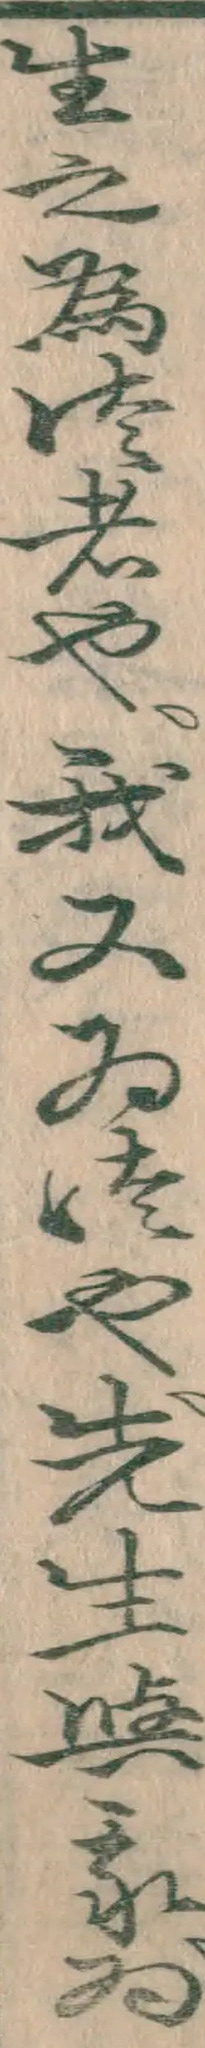生之為淡者也。我又為淡也。先生與我。為
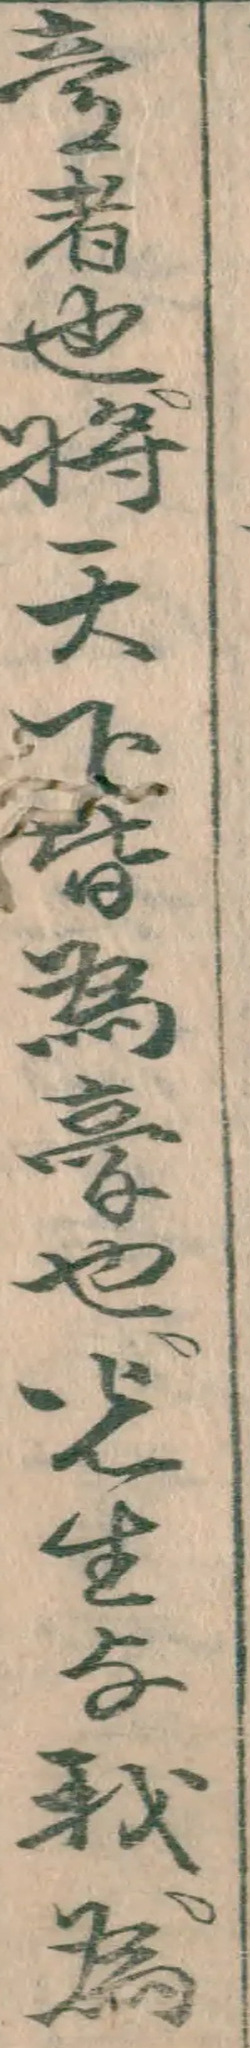膏者也。將天下皆為膏也。先生与我。為
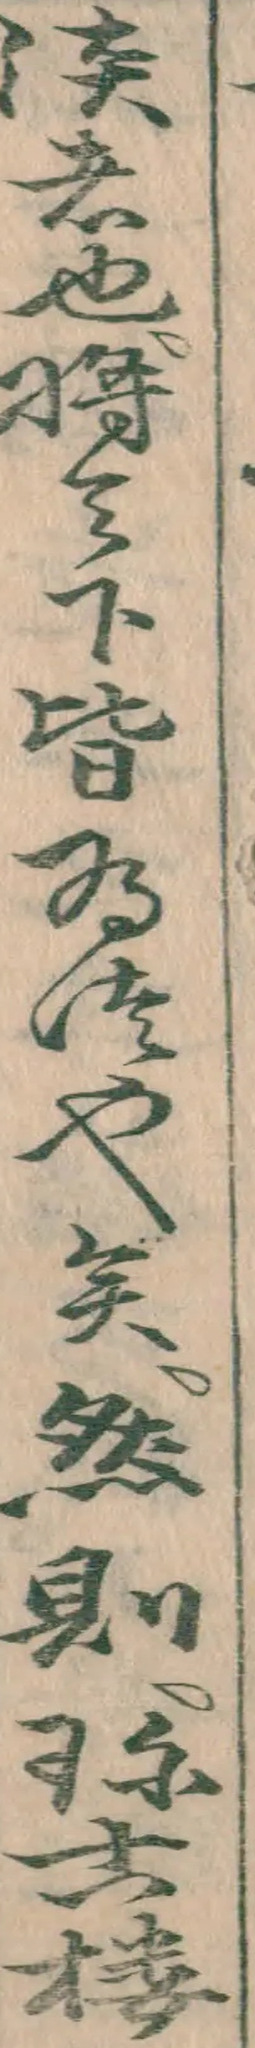淡者也。將天下皆為淡也矣。然則。珎古楼
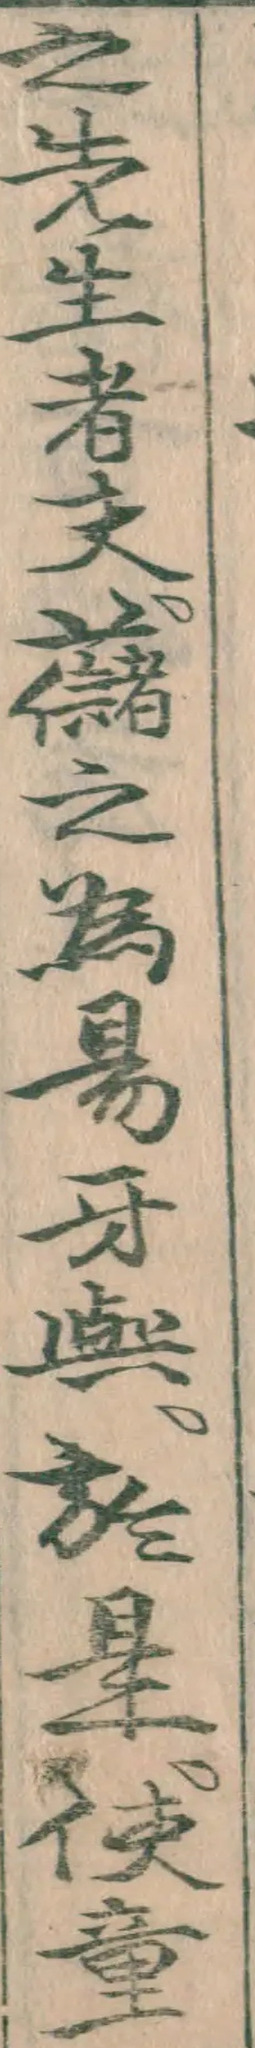之先生者交。藷之為易牙與。於是。使童
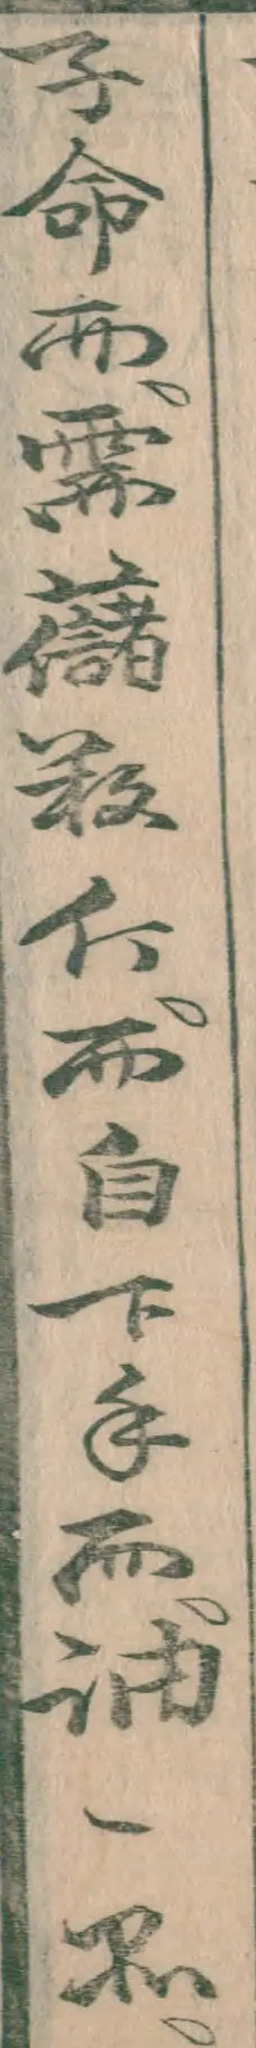子命而。需藷数斤。而自下手而。油一品。
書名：甘藷百珍
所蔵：国立国会図書館 National Diet Library, JAPAN
